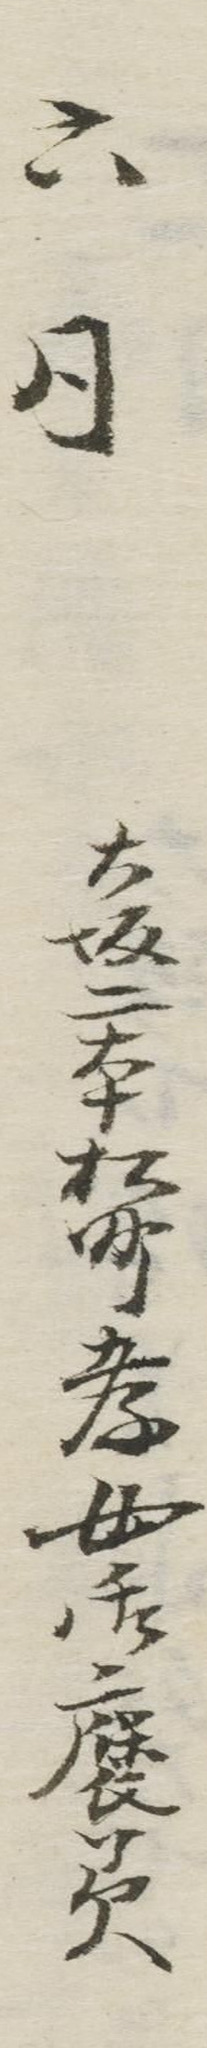六月大坂二本松町孝女御褒美
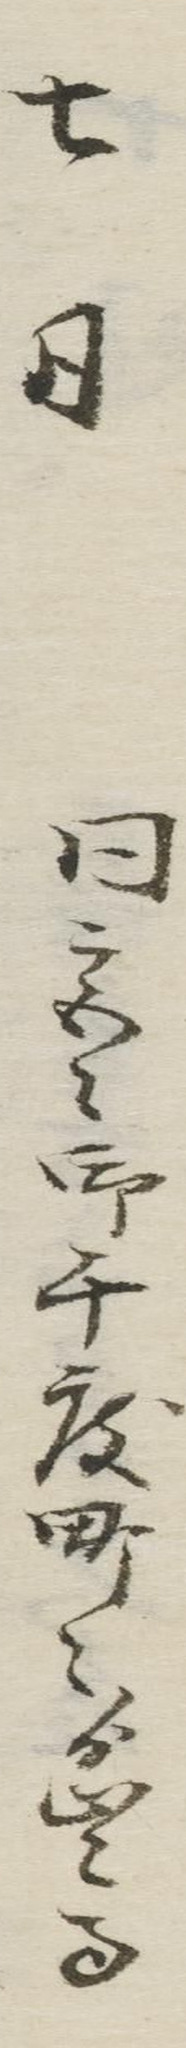七月同宮ニ御千度町々ゟ出る
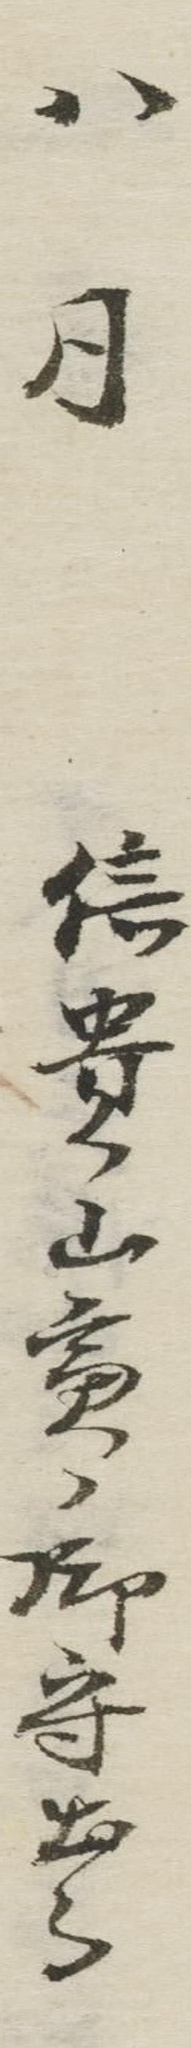八月信貴山寅ノ御守出る

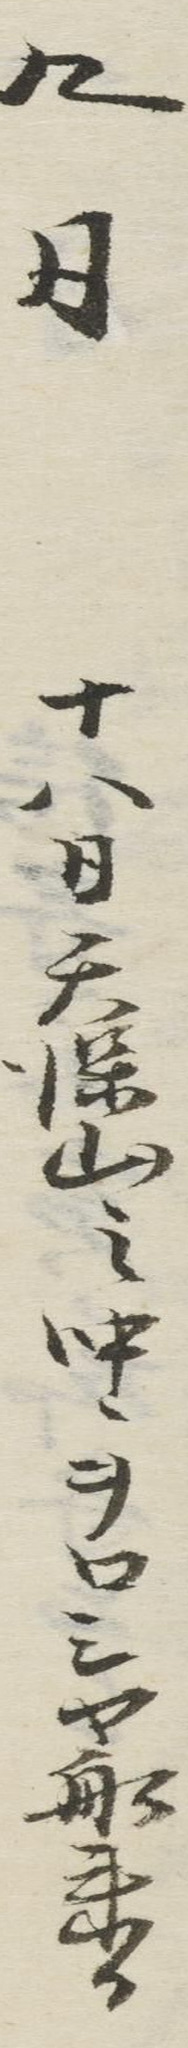九月十八日天保山之沖ヘヲロシヤ船来る
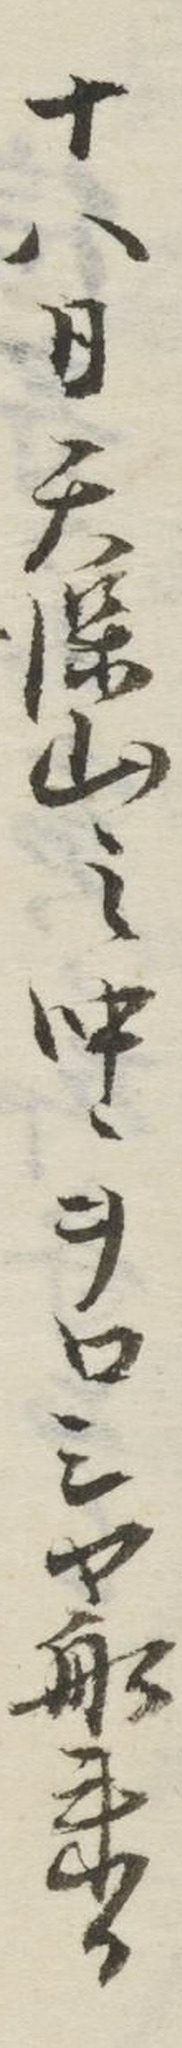九月十八日天保山之沖ヘヲロシヤ船来る
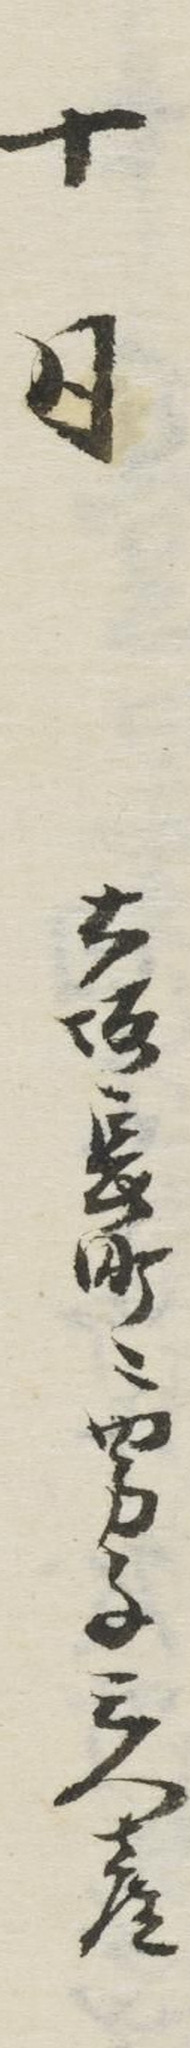十月大坂長町ニ男子三人産
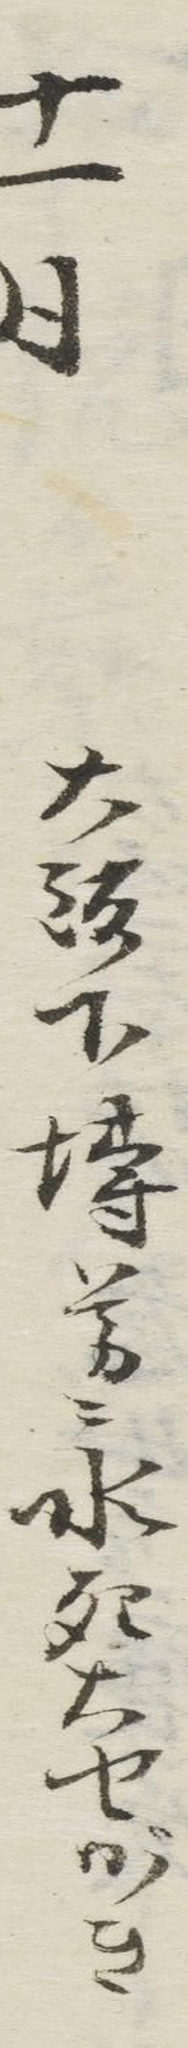十一月大阪下博労町ニ水死大セガキ
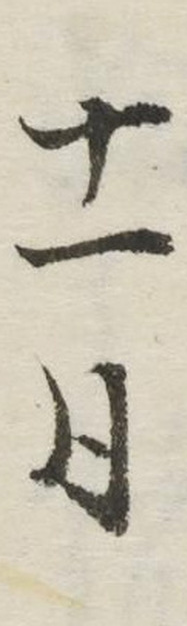十二月
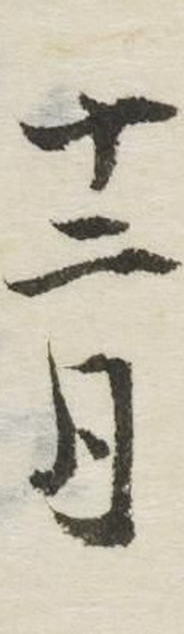十二月
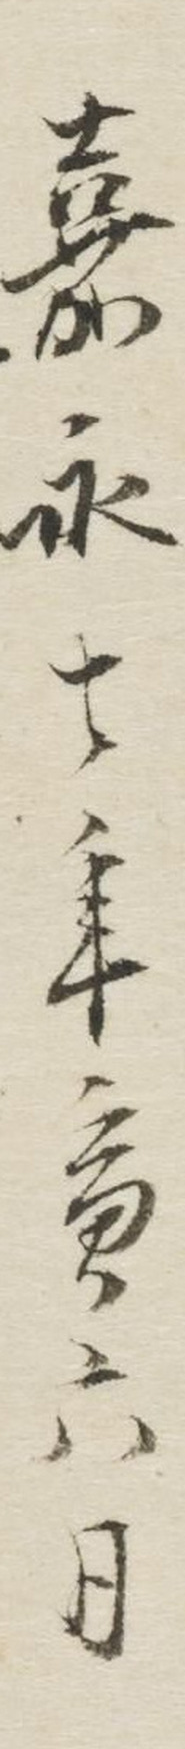嘉永七年寅六月
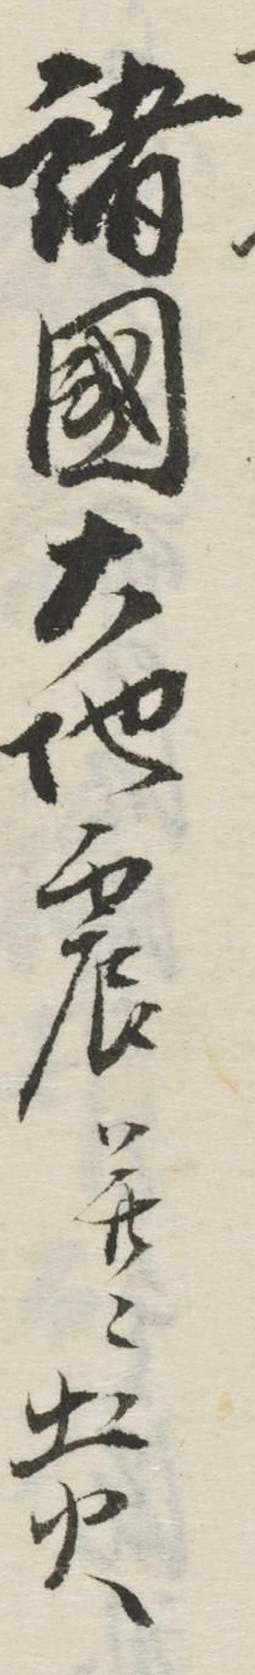諸国大地震幷ニ出火
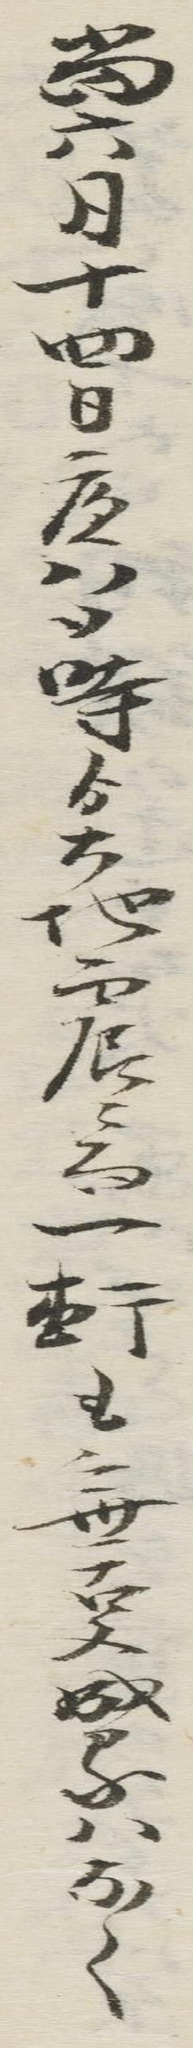当六月十四日夜八ツ時ゟ大地震に而一軒も無事成家ハなく
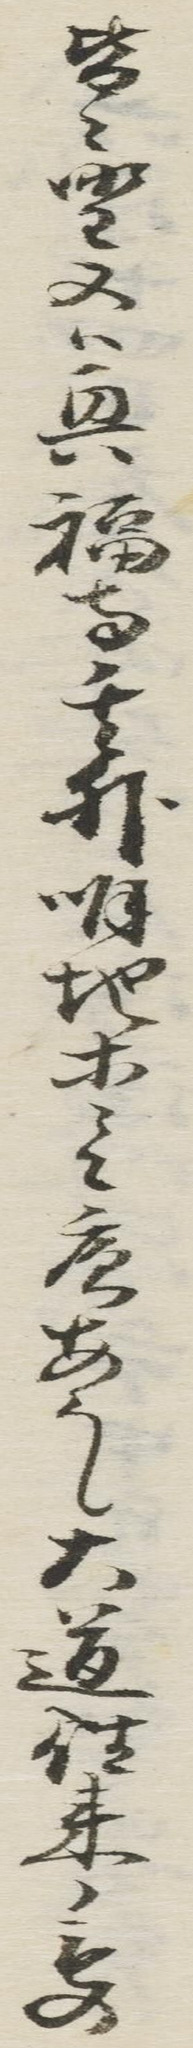皆々野又ハ興福寺其外明地等ニて夜あかし大道往来ノもの
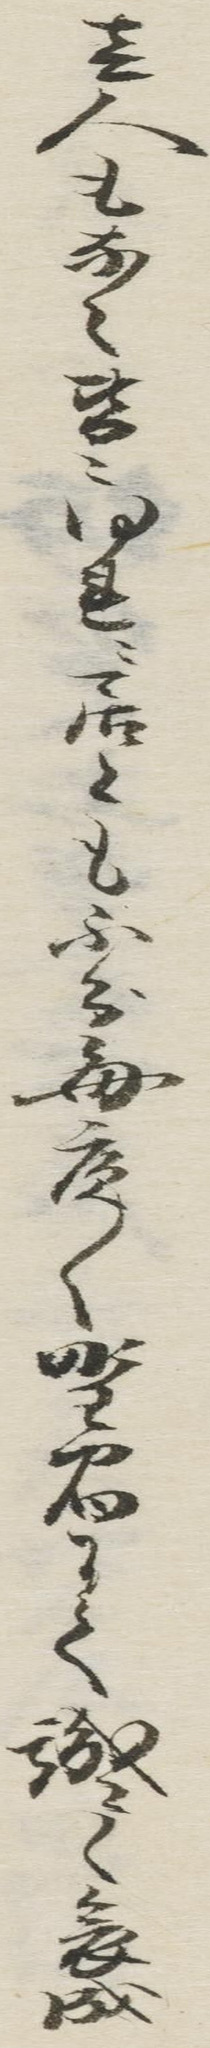壱人もなく皆々何れニ居とも不分毎夜〳〵野宿にて誠二〳〵念成
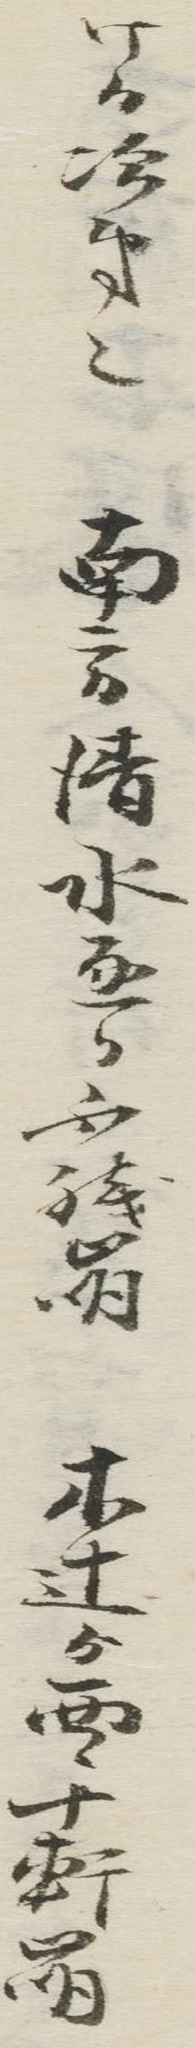ける次第也南方清水通り不残崩木辻ゟ西ニ十軒崩
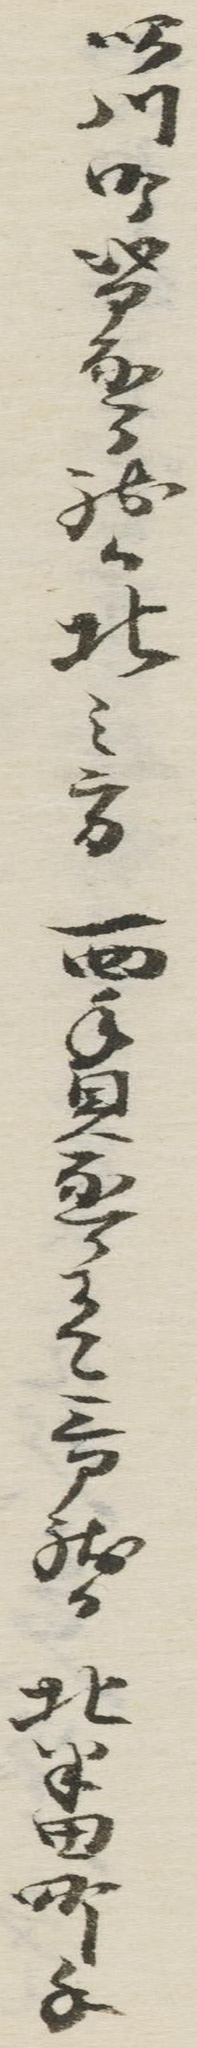鳴川町二部通り然り北之方西手貝通りまて三部然り北半田町手
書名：諸国大地震大津波一代記
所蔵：東京大学地震研究所図書室 Earthquake Research Institute Library, The University of Tokyo, JAPAN
